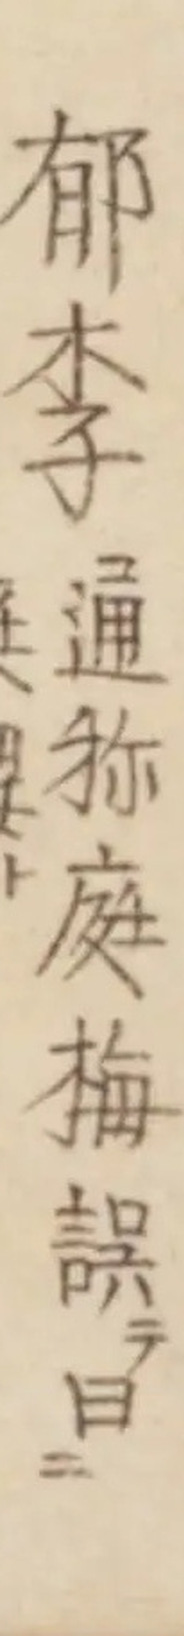郁李通称庭梅誤テ曰
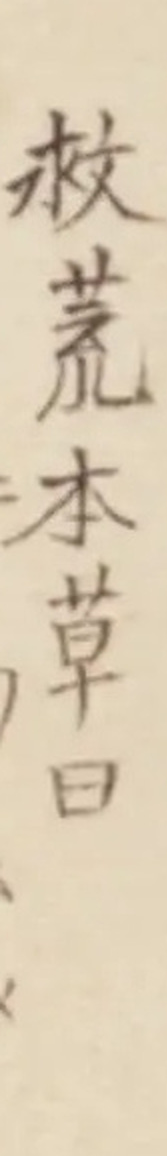救荒本草曰
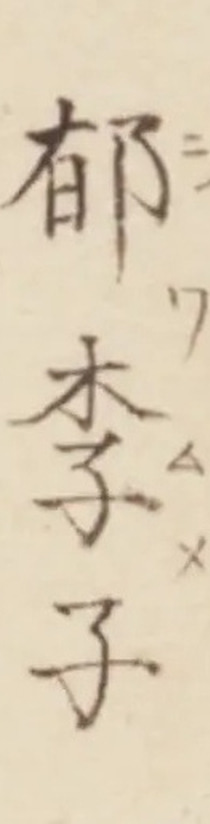郁李子
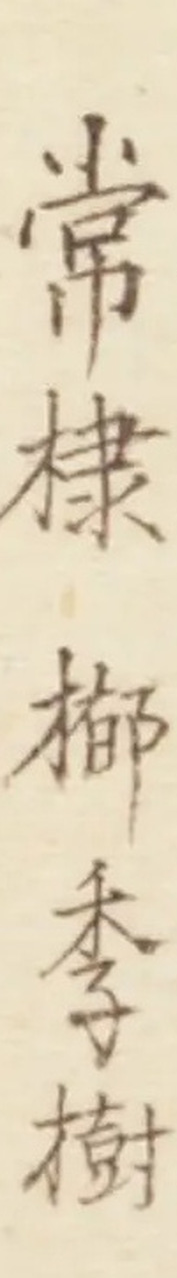常棣椰季樹
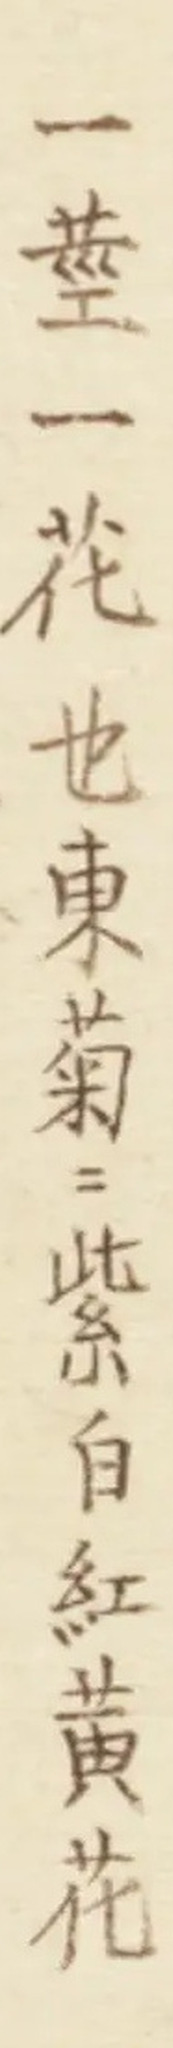東菊一莖一花也東菊ニ紫白紅黄花
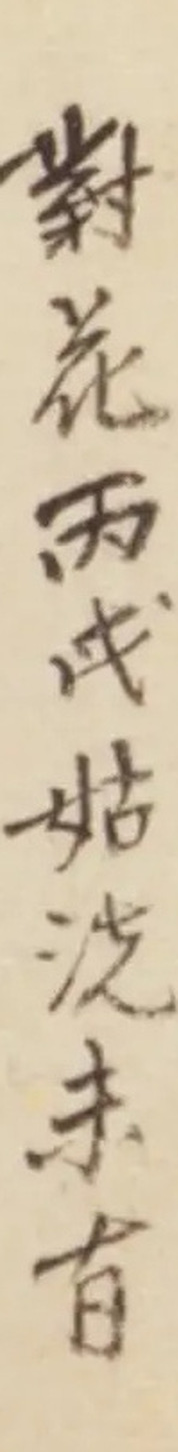對花丙戌姑洗有

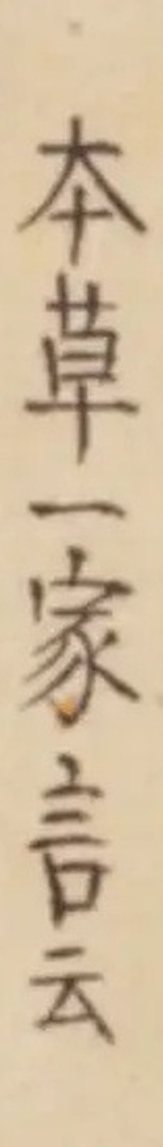本造一家言云
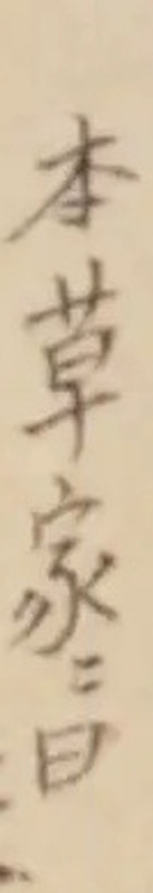本草家ニ曰
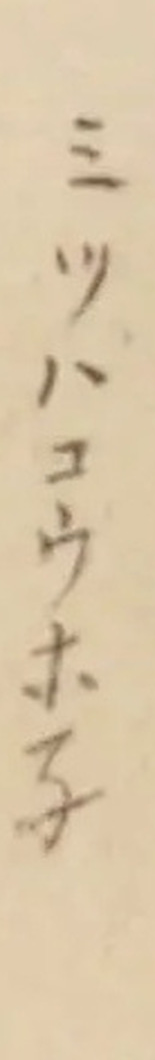ミツハコウホネ
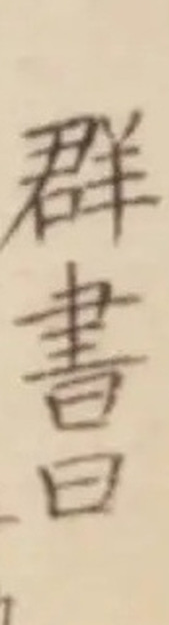群書曰
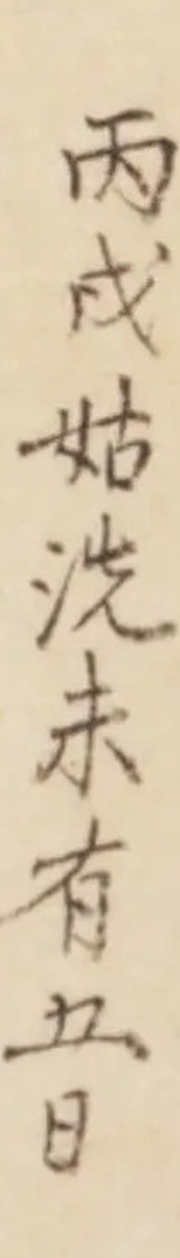丙戌姑洗末有五日
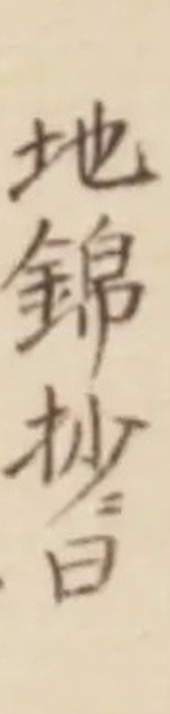地錦抄ニ曰
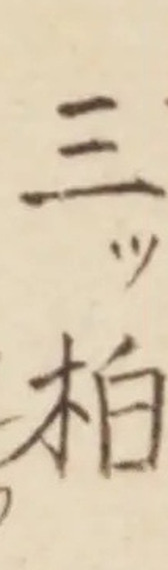三ツ柏
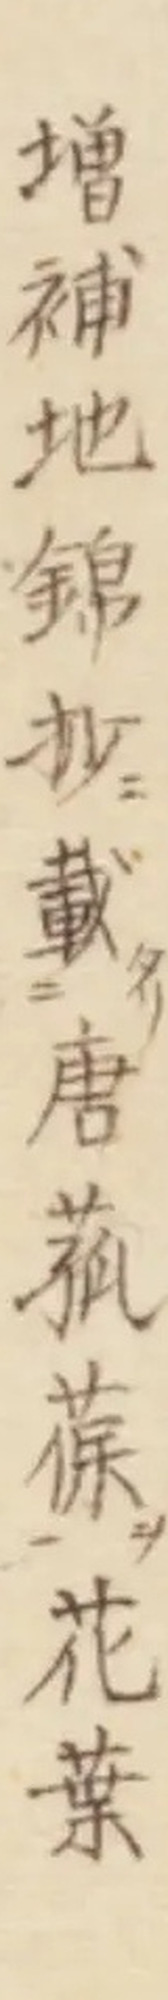増補地錦抄ニ載タリ唐菰葆ヲ花葉
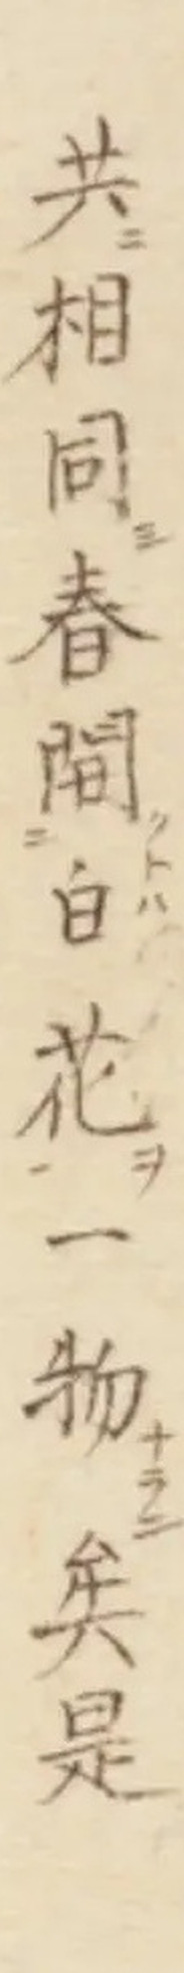共ニ相同シ春開クトハ白花ヲ一物ナラン乎是
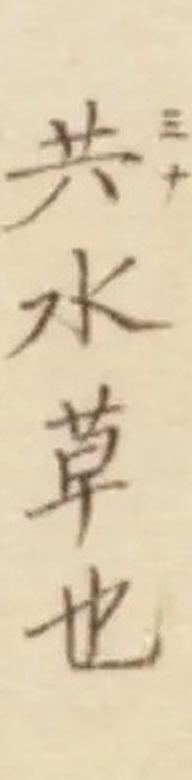共水草也
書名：梅園草木花譜春之部. 3
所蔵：国立国会図書館 National Diet Library, JAPAN
